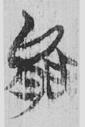能
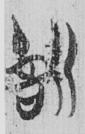○（慎）
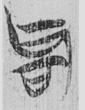○（始）
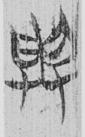斯與
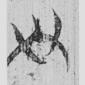夂（終）
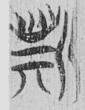斯
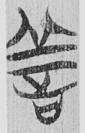善
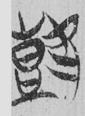○（矣）
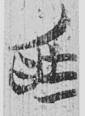爲
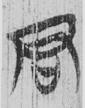君
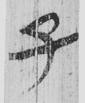子
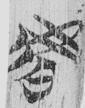○（乎）
